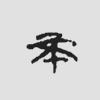不
